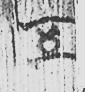五
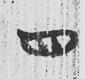四
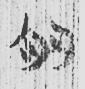刖
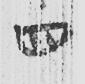四
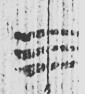三
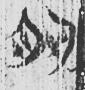刖
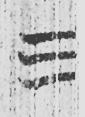三
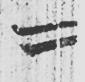二
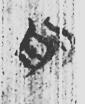刖
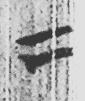二
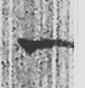一
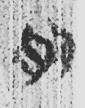刖
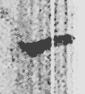一
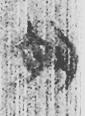刖
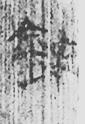釮
